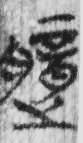腹
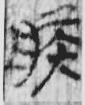疾
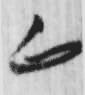㠯（以）
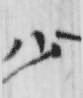少
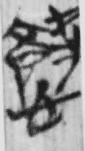○（氣）
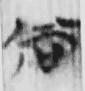尚
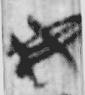母
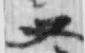又（有）
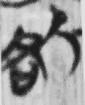咎
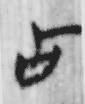占
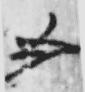之
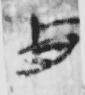貞
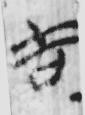吉
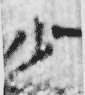少
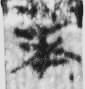未
